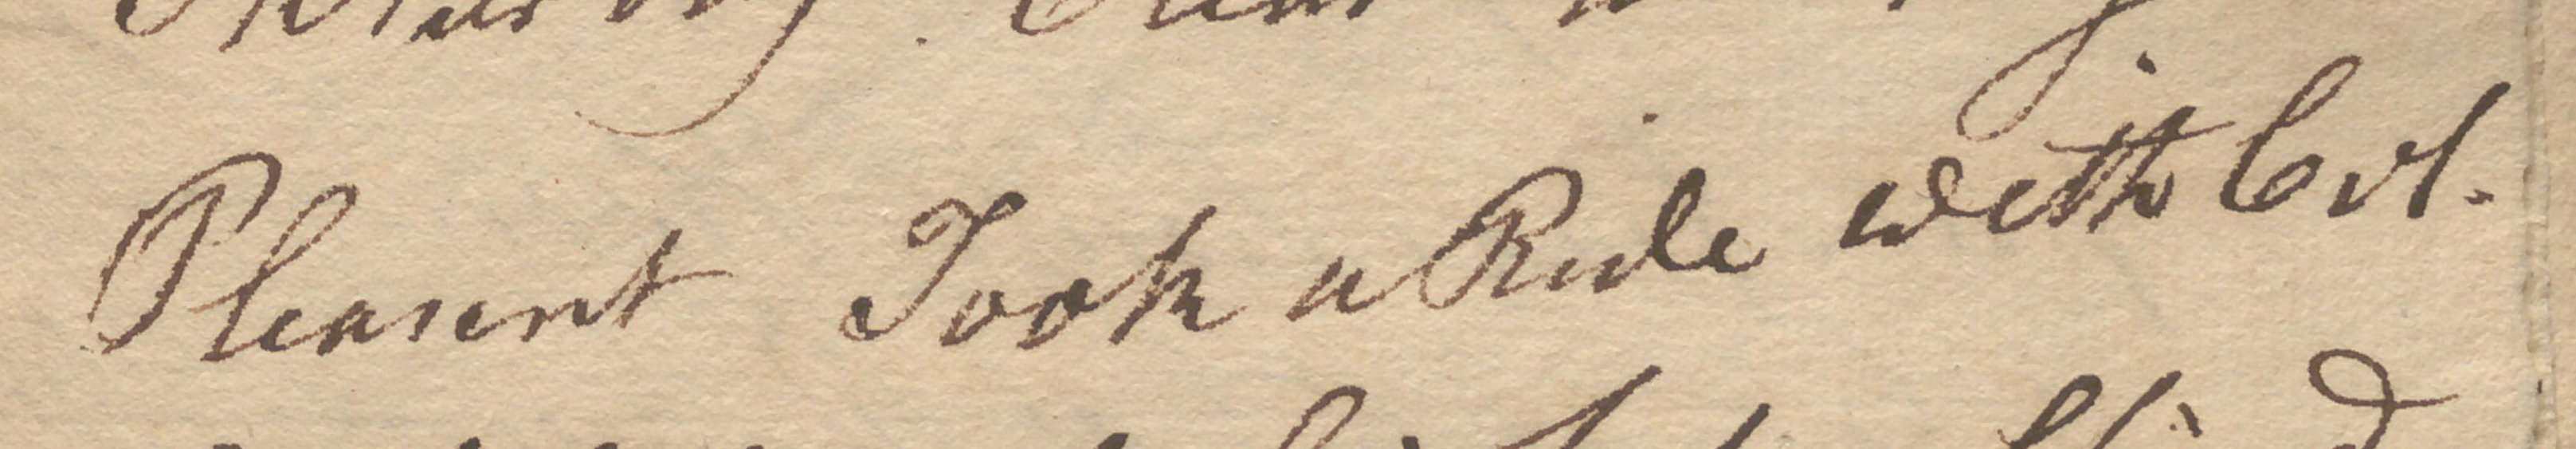Pleasent Took a Ride with Col.
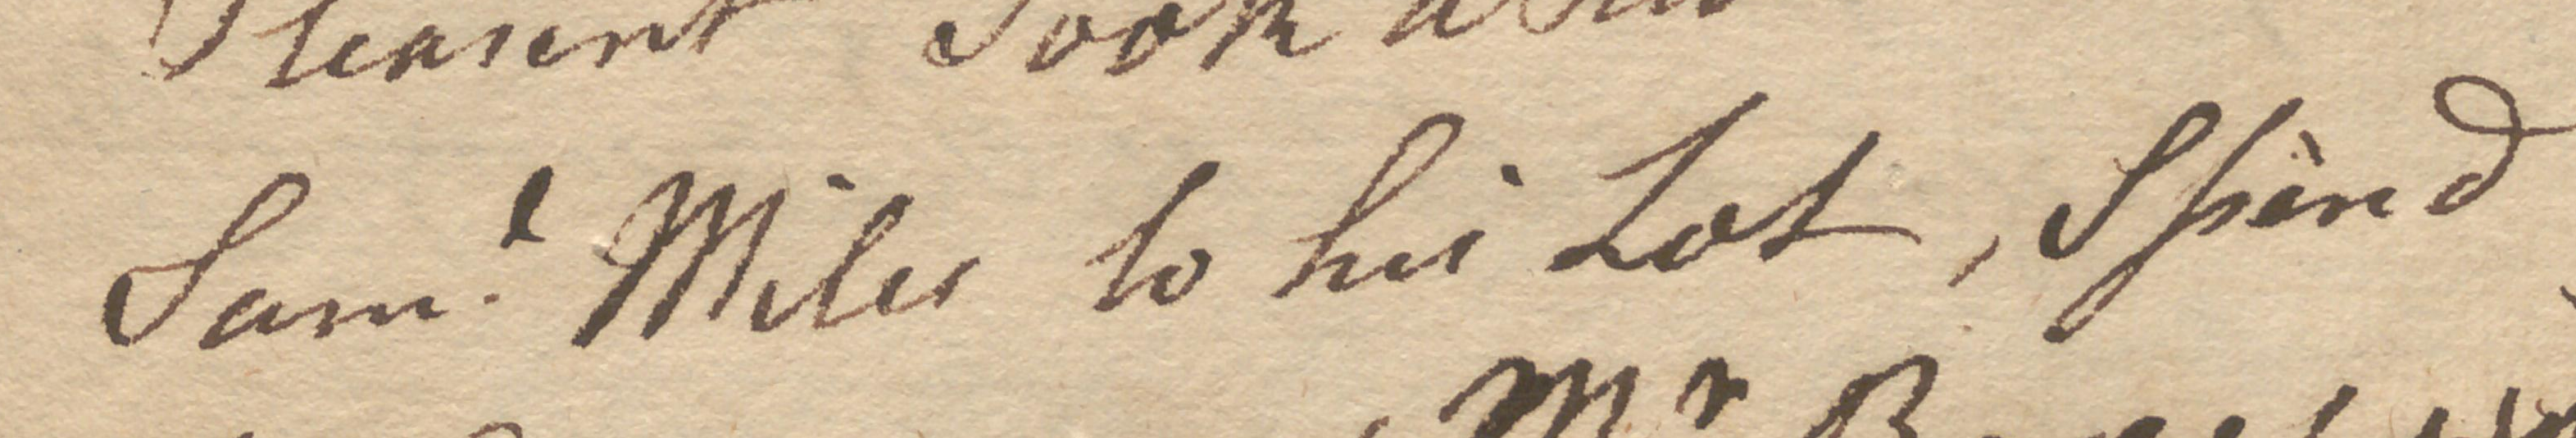Sam^l. Miles to his Lot, Spend
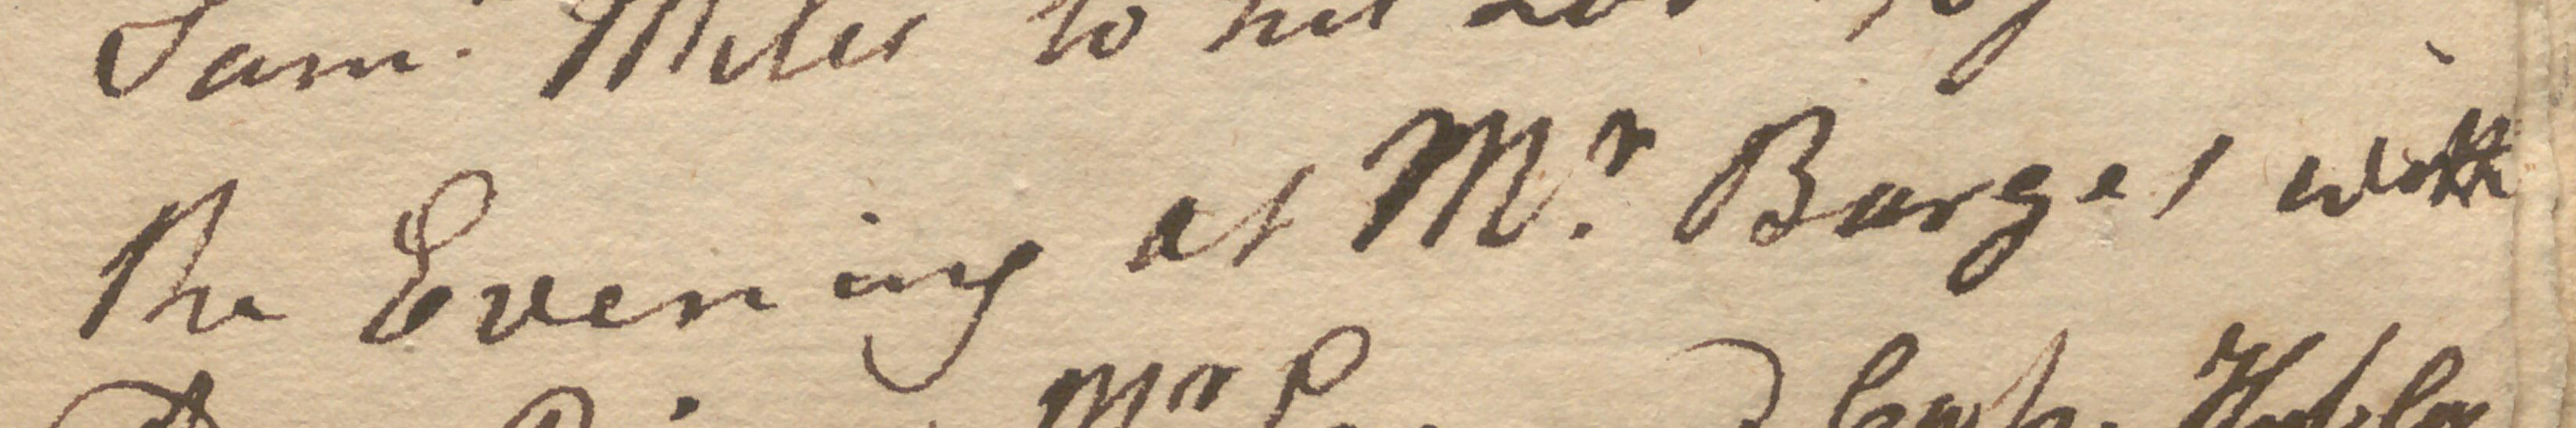the Evening at M^r. Barges with
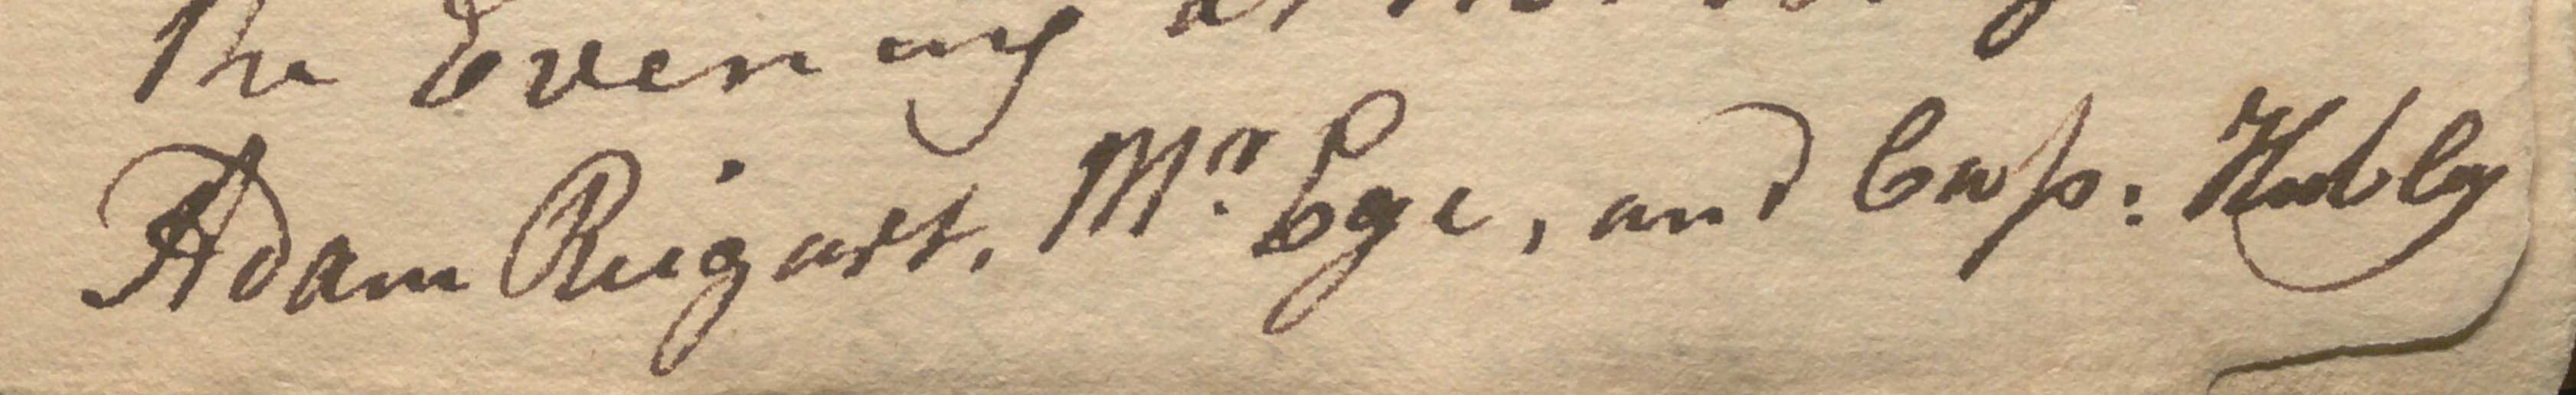Rdam Reigart. M^r. Ege, and Coop. Hubley
